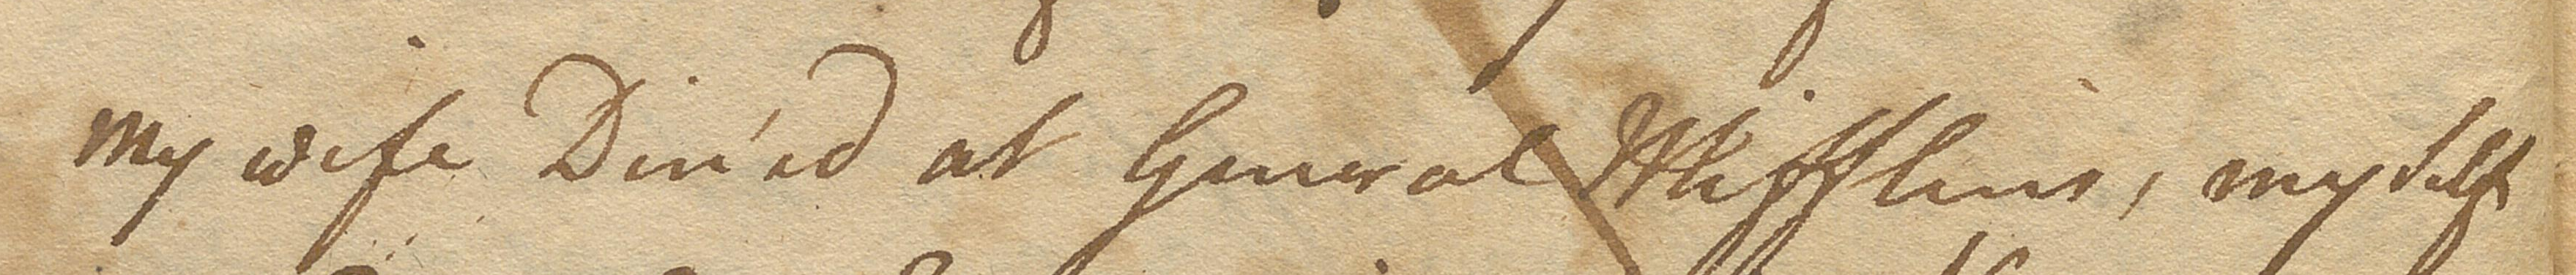my wife Dined at General Mlifflins, my Self
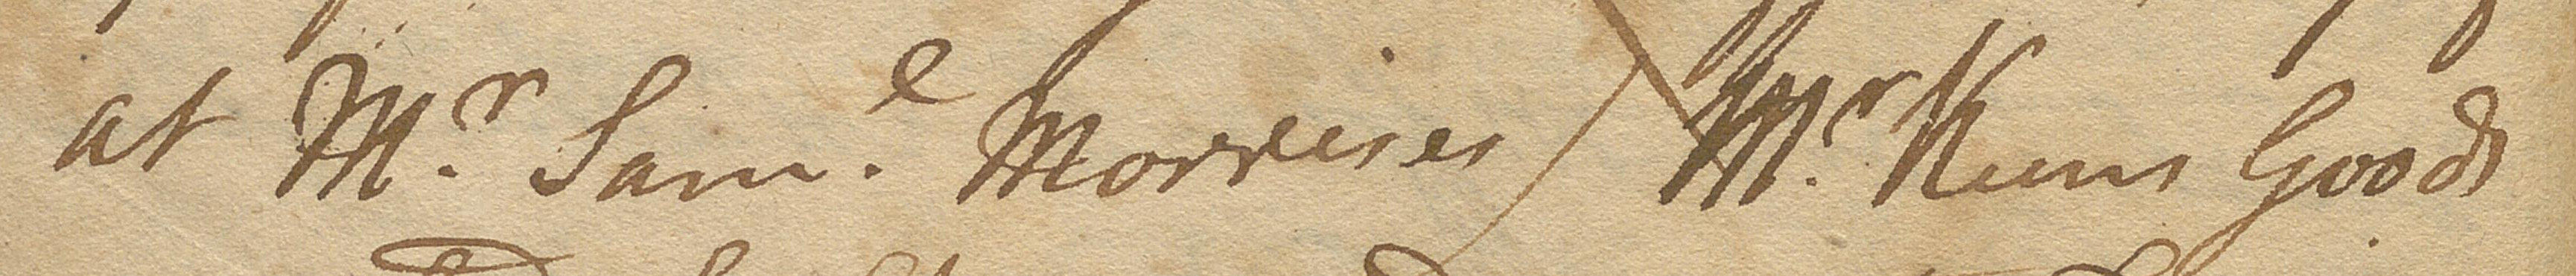at M^r. Sam^l. Morrises) M^r. Kuns Goods
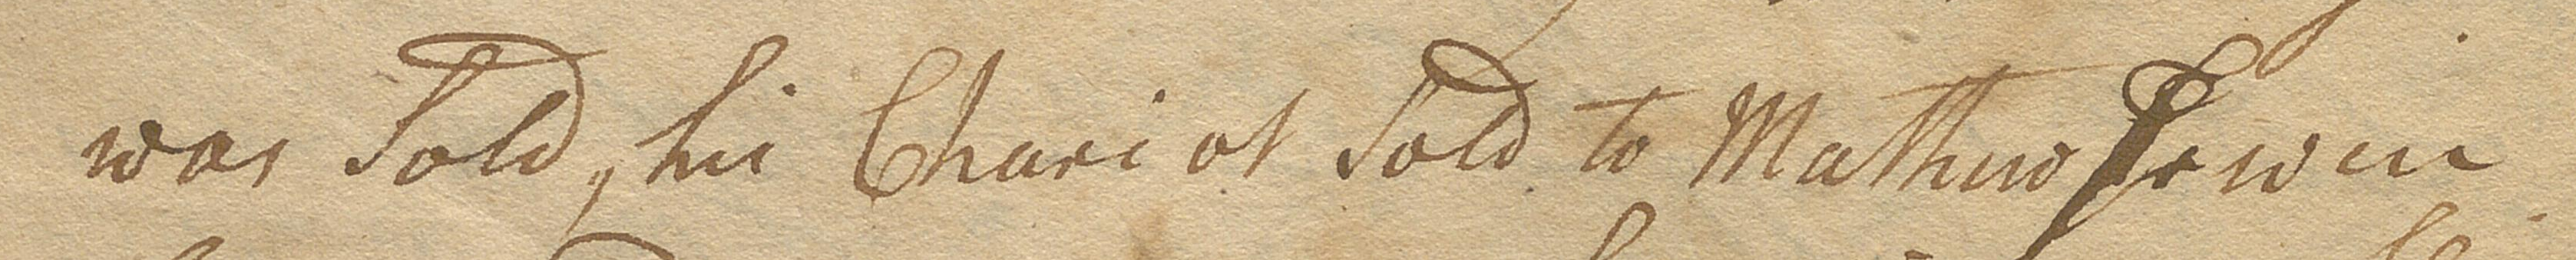was sold, his Chariot sold to Mathew Irwin
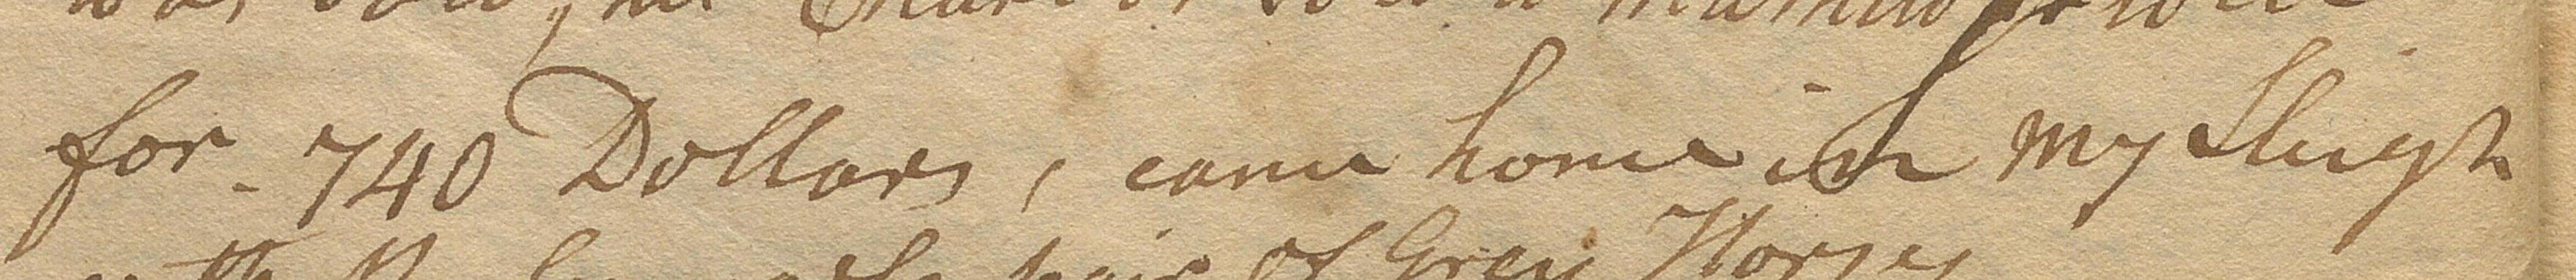for- 740 Dollars, came home in my Sleigh
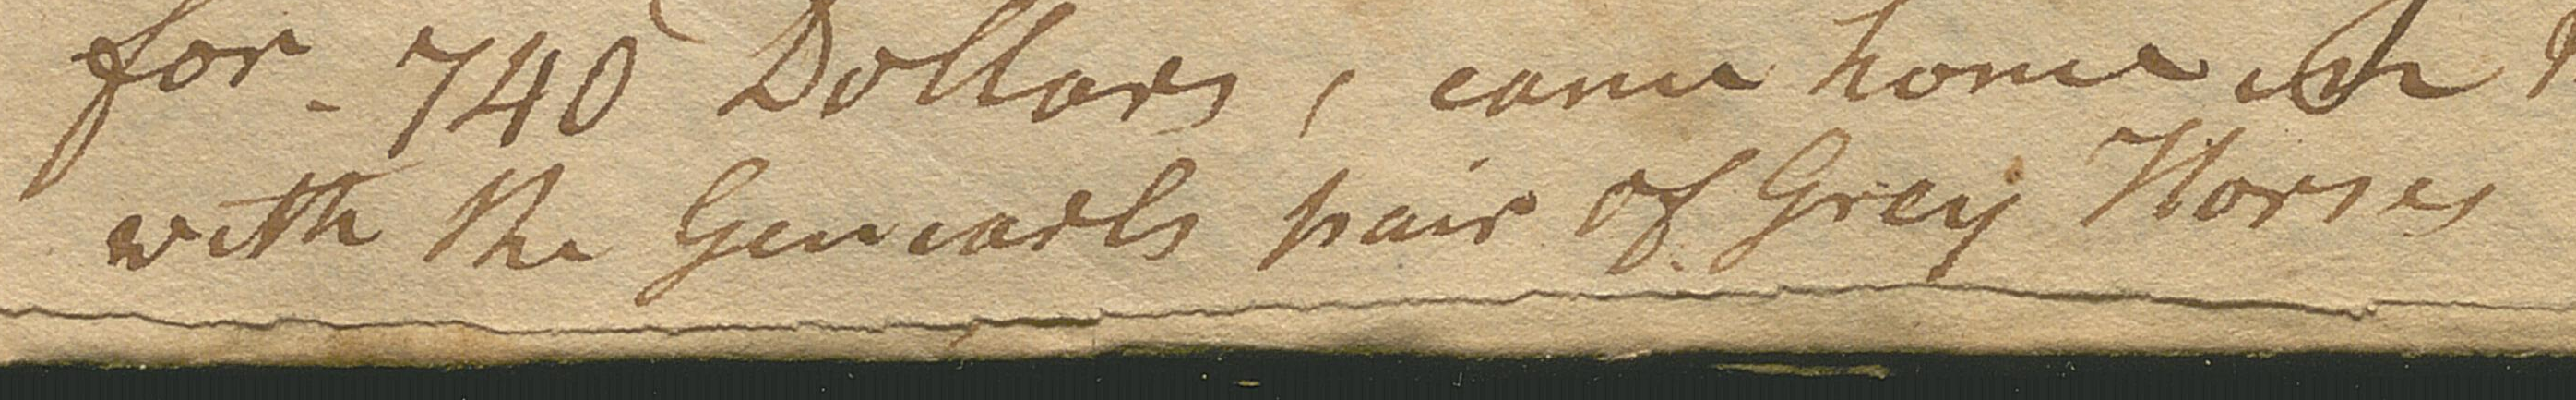with the Genearls pair of Grey Horses
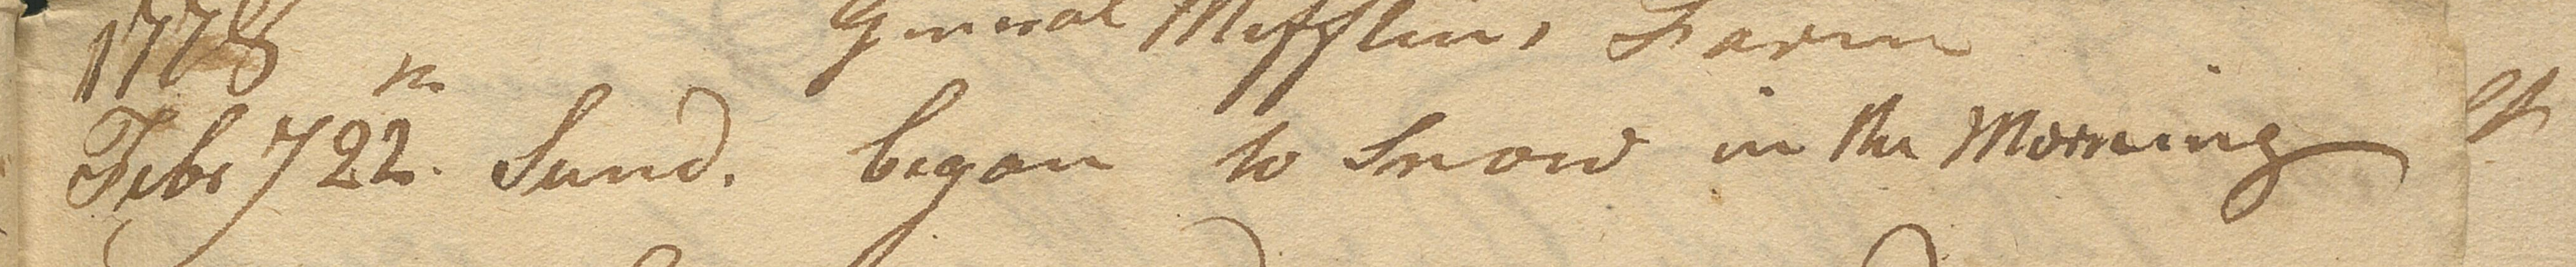Febr^y 22^th. Sund. began to snow in the Moming
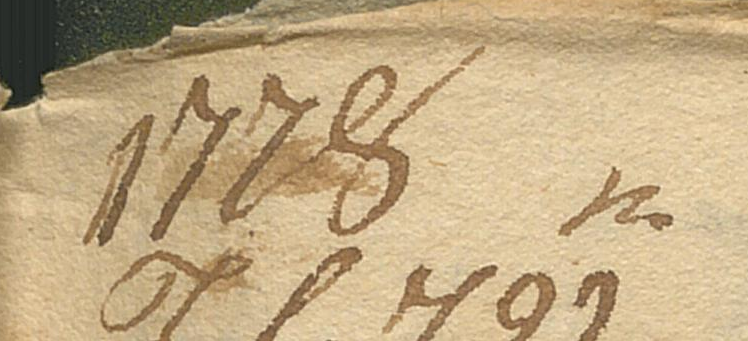1778
